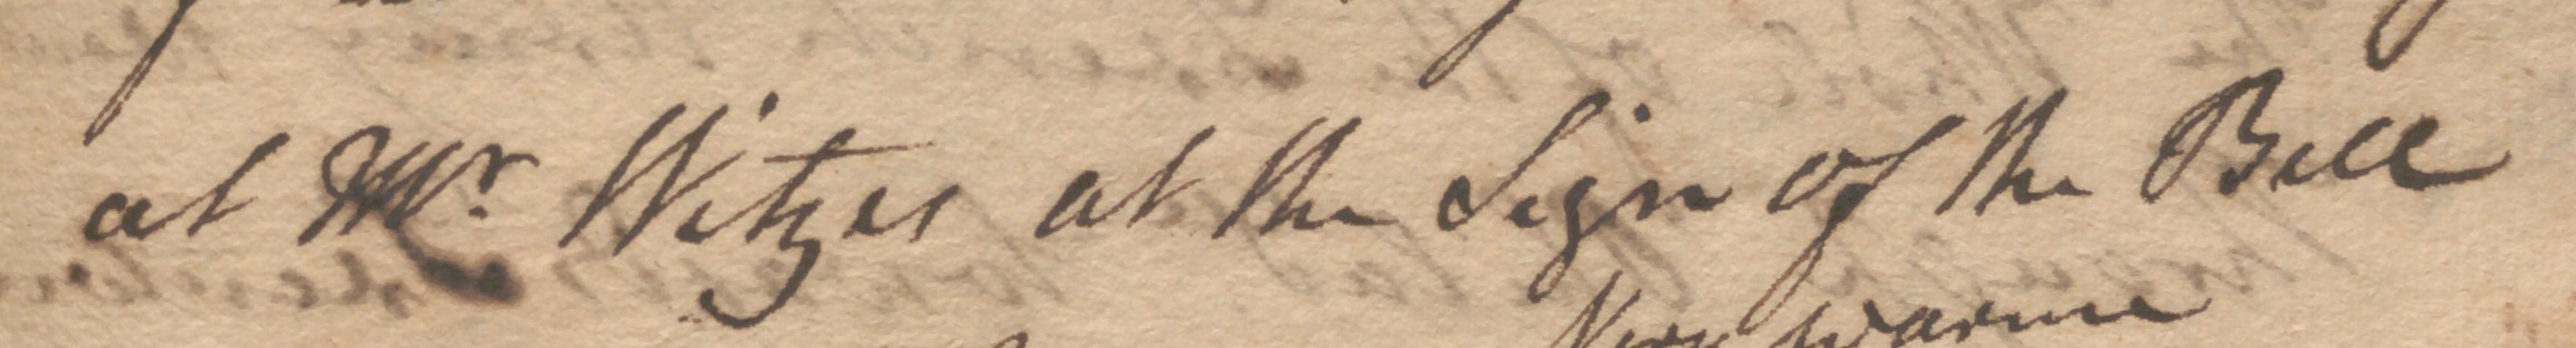at M^r. Witzes at the sign of the Bell
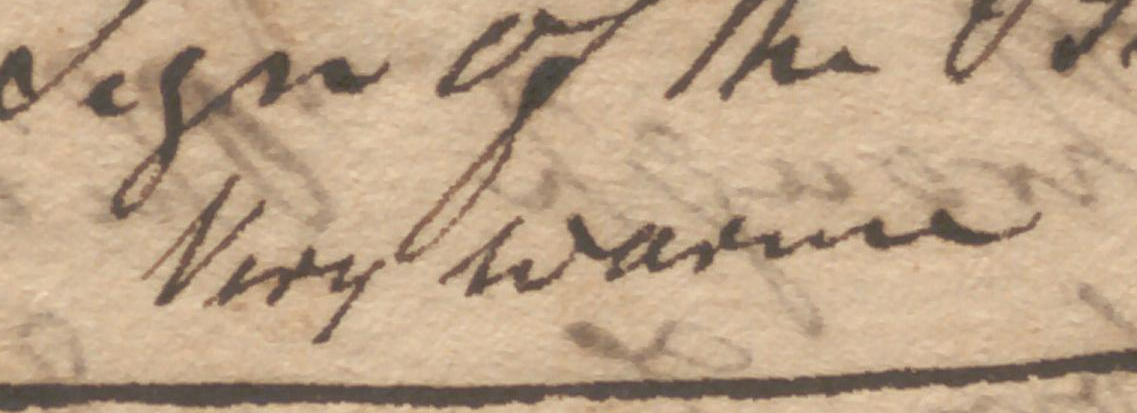Very warme
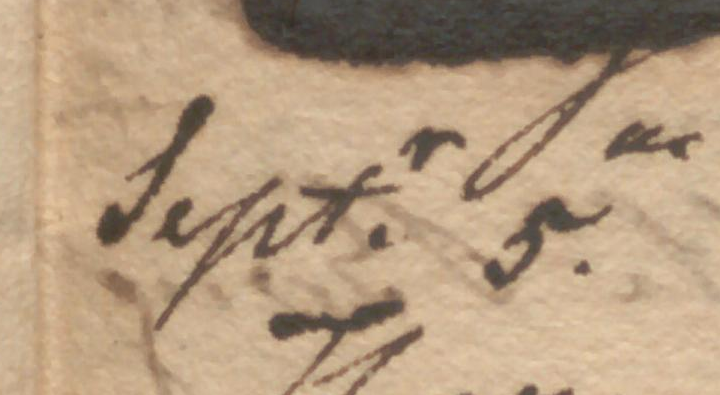Sept^r. 5^th
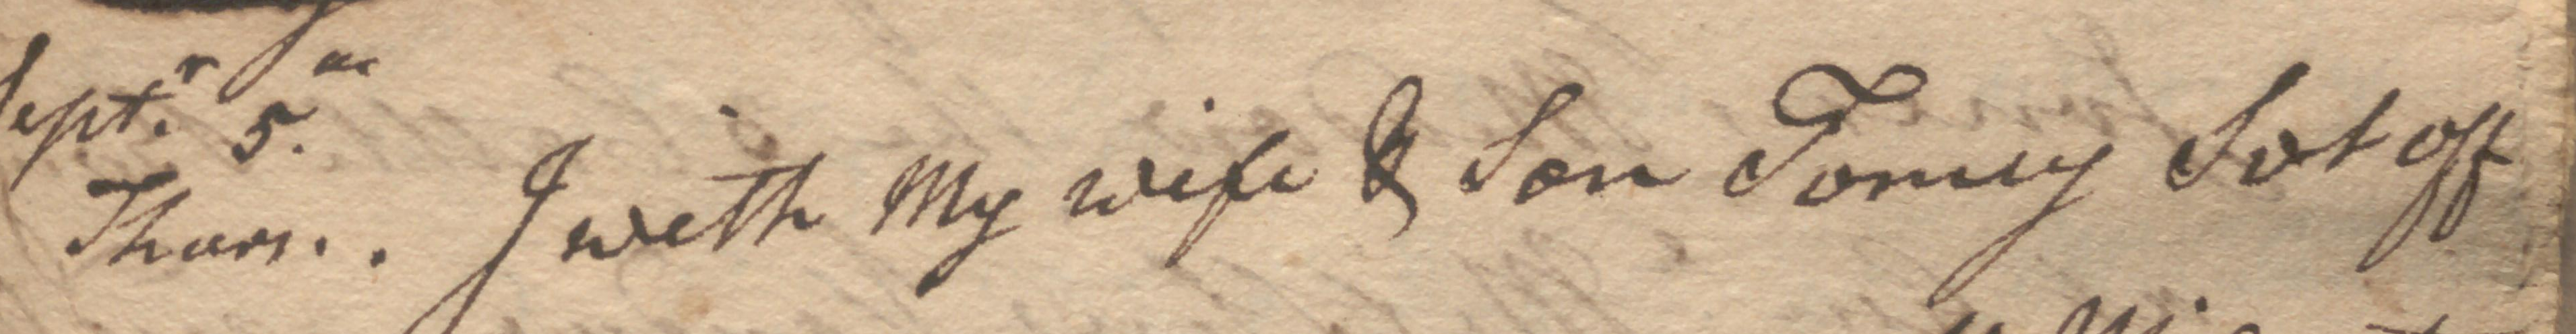Thurs. I with My wife & Son Tomey Set of
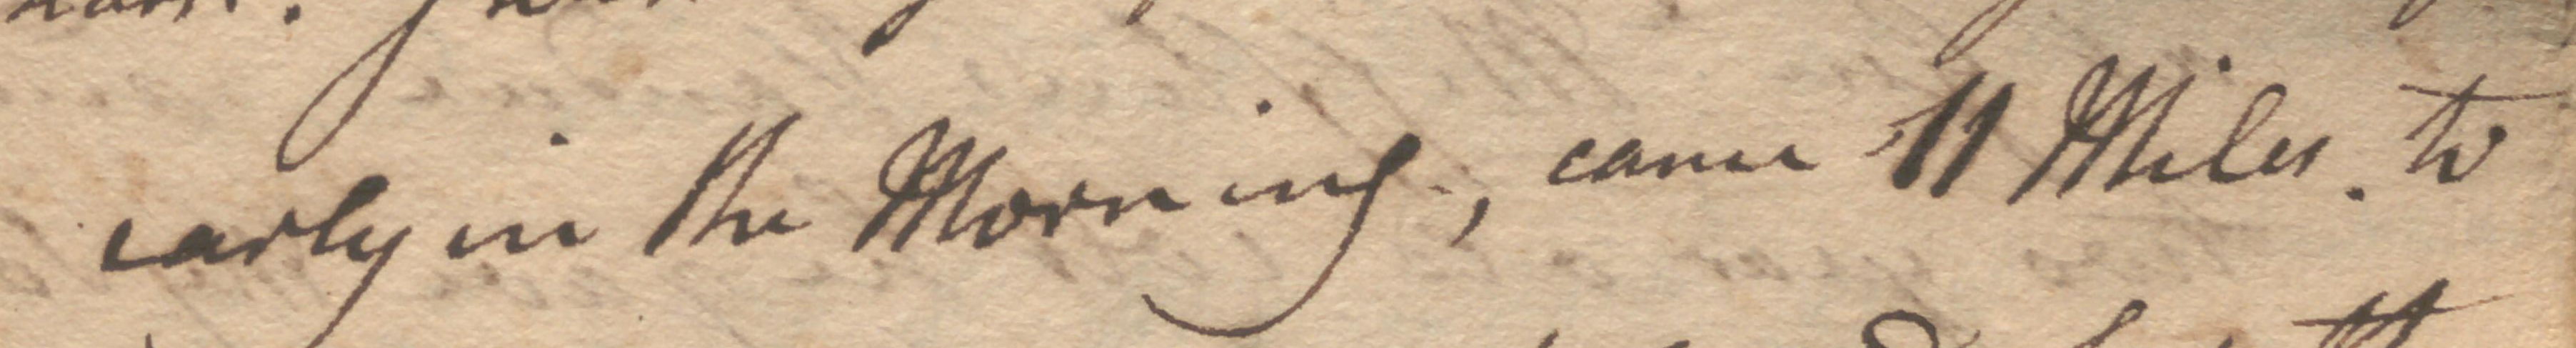early in the Morning, came 11 Miles to
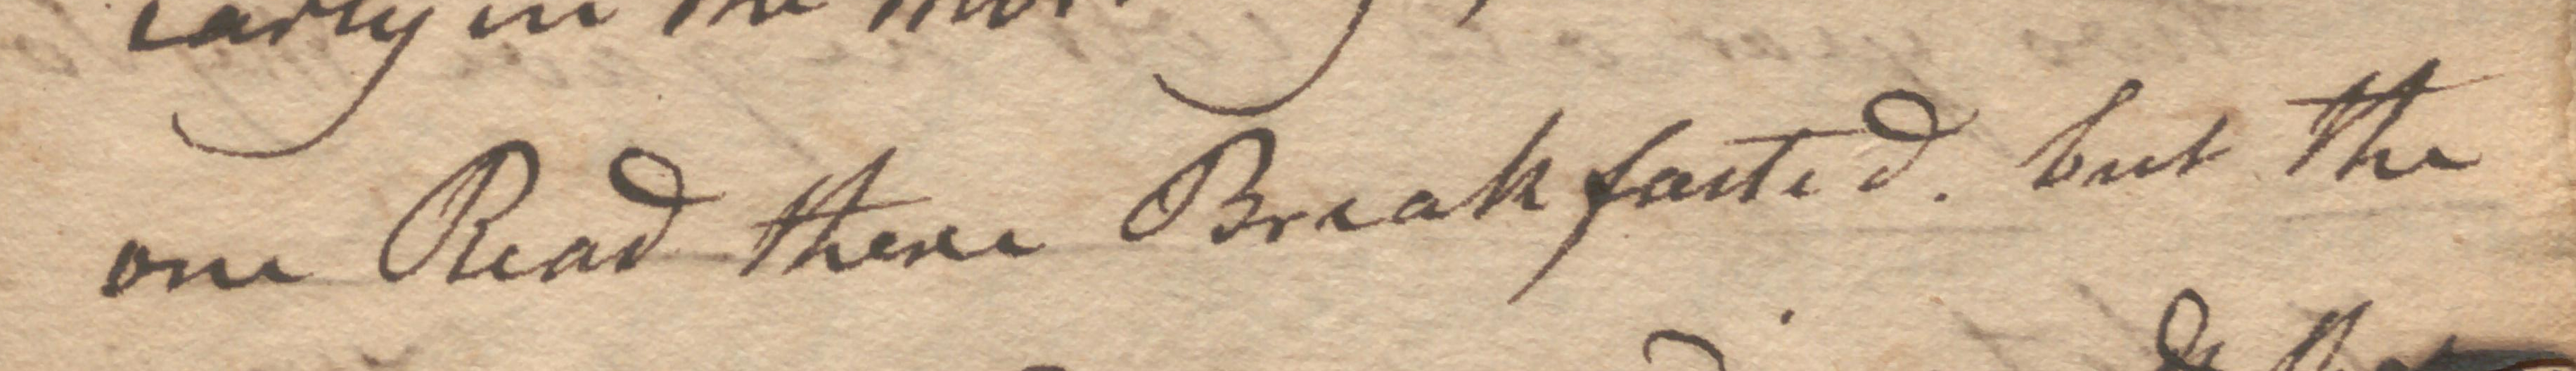one Read there Breakfasted. but the
